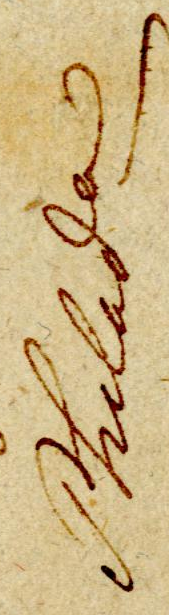Philad^a-
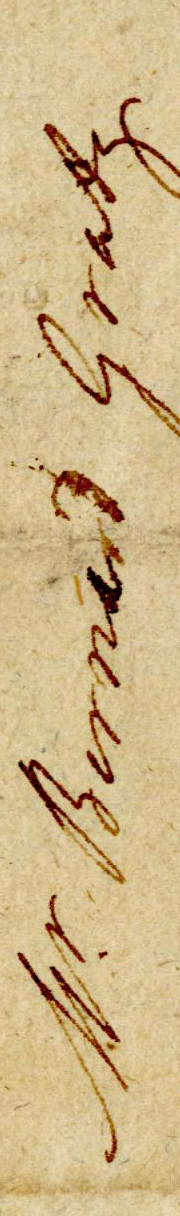M^r Barnard Gratz
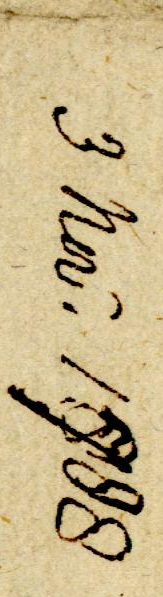3 Nov 1788
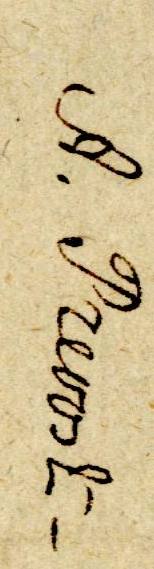A. Prevost
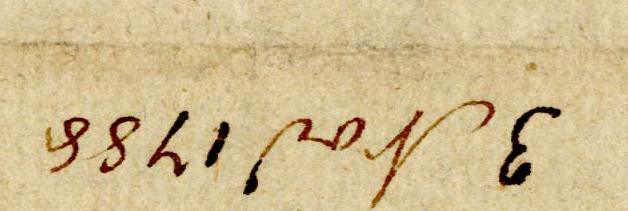3 Nov 1788
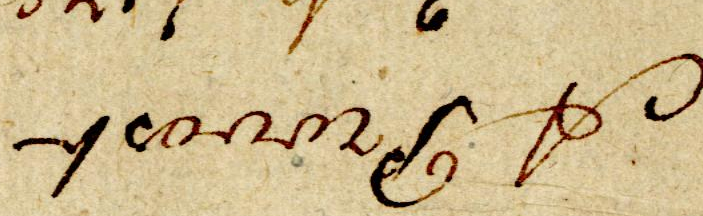A Provost
